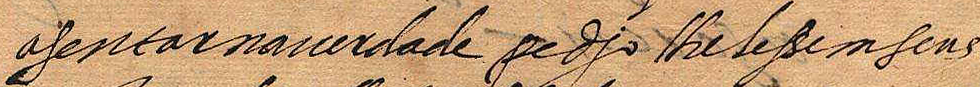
asentar na uerdade pedjo lhe lessem seus
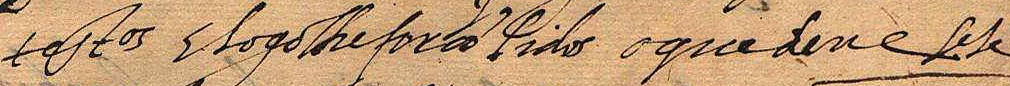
testos E logo lhe foraõ lidos o que deue setembro
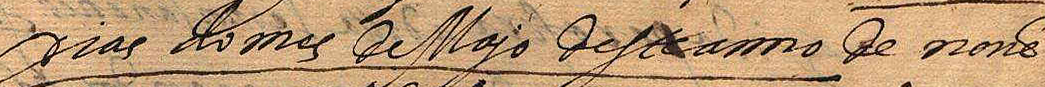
dias do mes de Majo deste anno de nouē
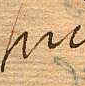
hic
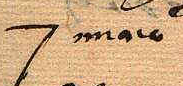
7 maio
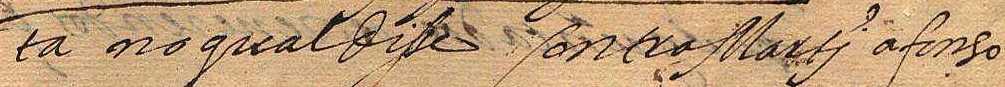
ta no qual disse Contra Martj̄ afonso
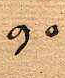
90
